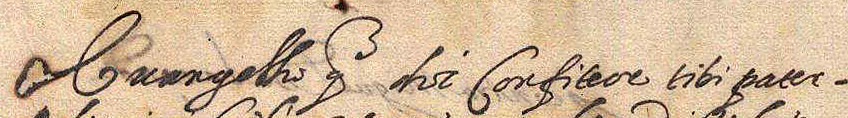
o Euangelho q̄ diz Confiteor tibi pater
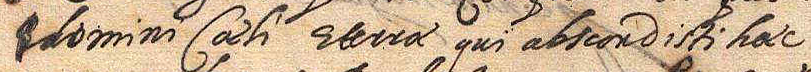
E domini Cæli Eterræ qui abscondisti hæc
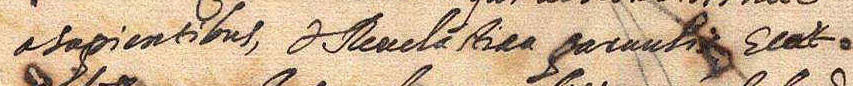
a sapientibus, & Reuelasti ea paruulis E cæt.
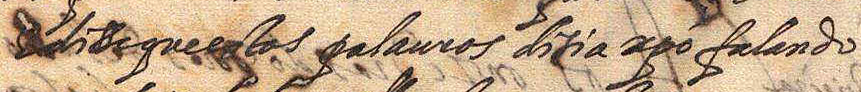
E disse que estas palauras disia xpō falando
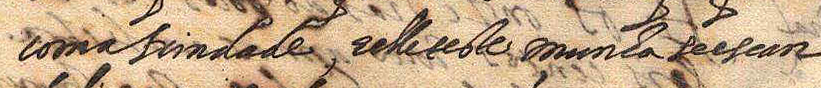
com a trindade, E elle testemunha se escan
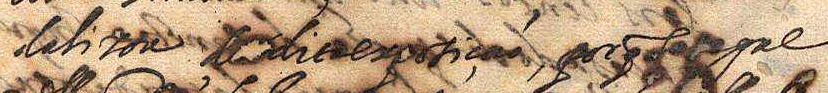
dalizou da dita exposição, porq̄ se segue
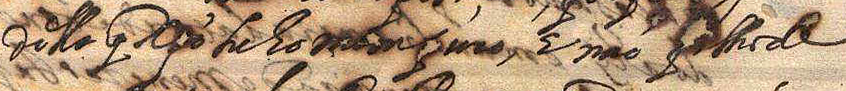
della q̄ xpō he homem puro, E naõ filho de
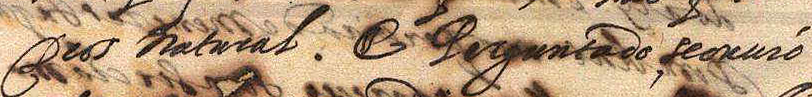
Deos natural. ⁋ Perguntado, se ouuio
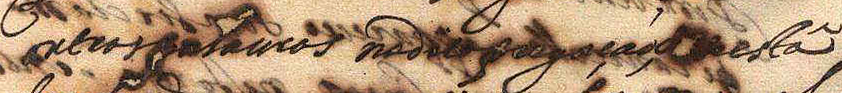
outras palauras na dita pregaçaõ, se estâ
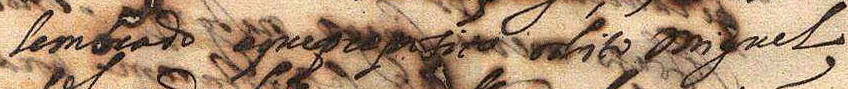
lembrado a que proposito o dito MigueL
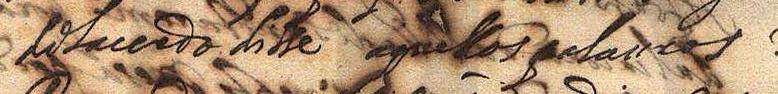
de Lacerda disse aquellas palauras?
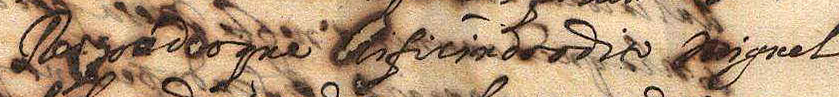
Respondeo que Refirindo o dito Miguel
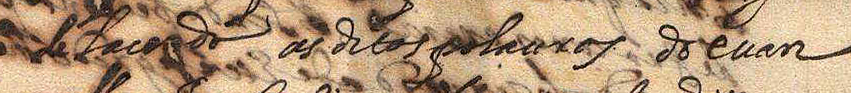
de Lacerda as ditas palauras do euan
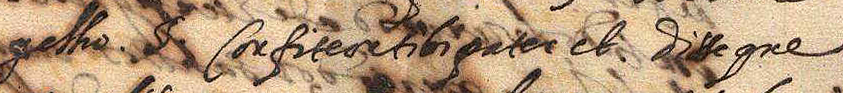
gelho. ss. Confiteor tibi pater et. disse que
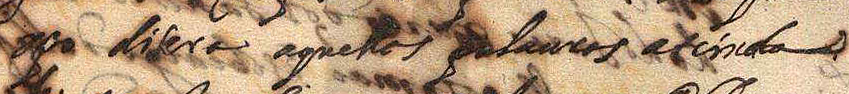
xpo disera aquellas palauras a trinda
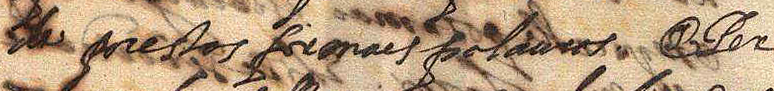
de por estas formaes palauras. ⁋ Per
